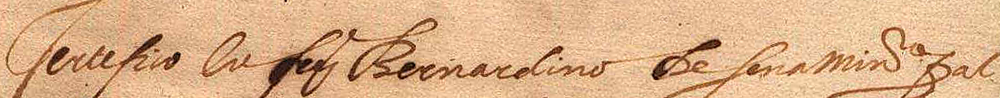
Certefico eu frej Bernardino De senaminra ꝓal
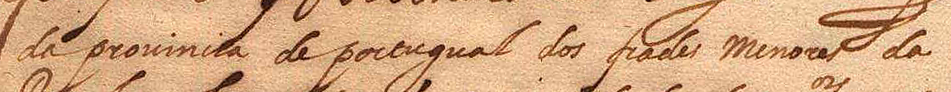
da prouinicia de portugual dos frades menores da
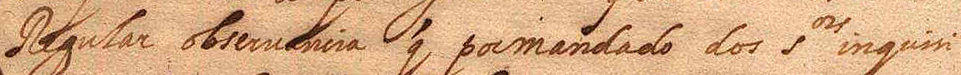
Regular obseruancia q̄ por mandado dos sors inquisi
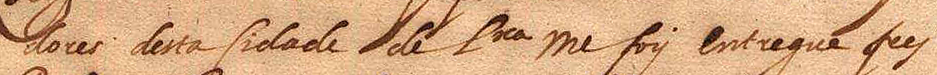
dores desta Cidade de Lxa me foy entregue frej
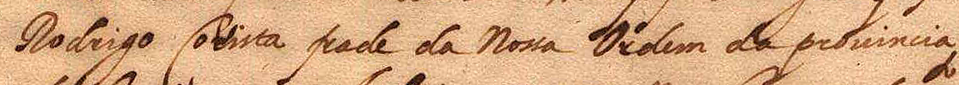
Rodrigo Corista frade da Nossa Ordem da prouincia
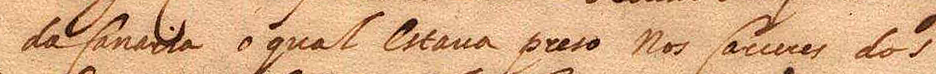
da Canaria o qual estaua preso nos Carceres do sto
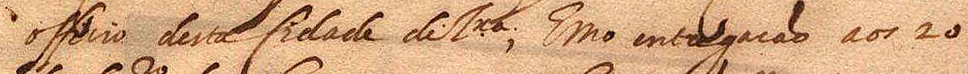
officio desta Cidade de Lxa; E mo entregaraõ aos 20
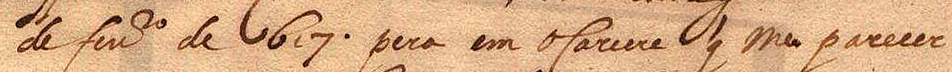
de feuro de 617. pera em o Carcere q̄ me parecer
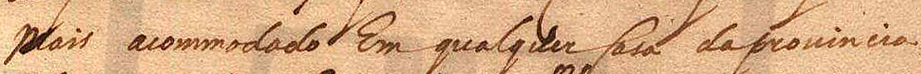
mais acommodado Em qualquer Casa da prouincia
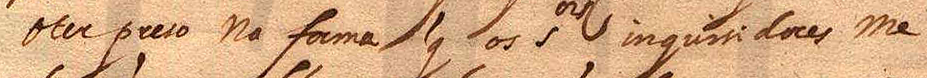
o ter preso na forma q̄ os sors inquisidores me
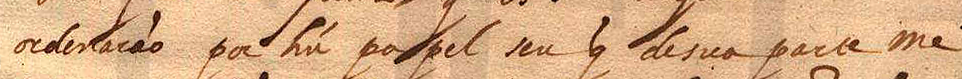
ordenaraõ por hū papel seu q̄ de sua parte me
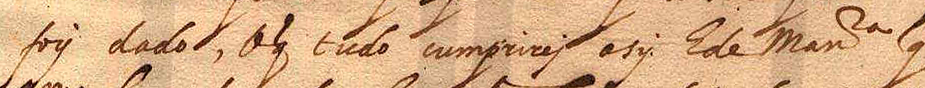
foy dado, O q̄ tudo cumprirej asy E de manra q̄
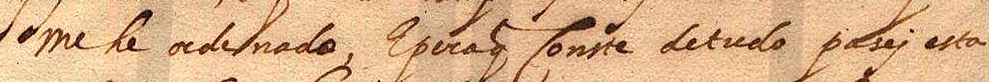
me he ordenado, E pera q̄ Conste de tudo pasej esta
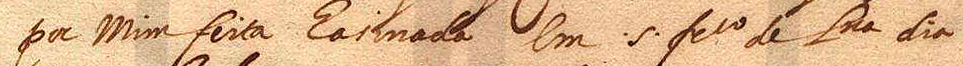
por mim feita E asinada em .s. frco de Lxa dia
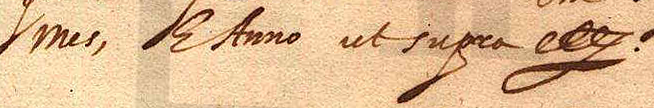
mes, E Anno ut supra ettꝭ.
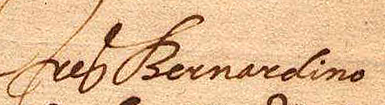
frej Bernardino
